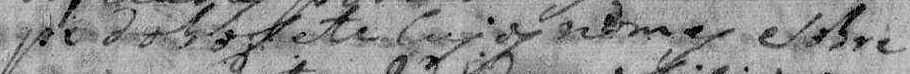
pe do bofete Cujos nomes sobre
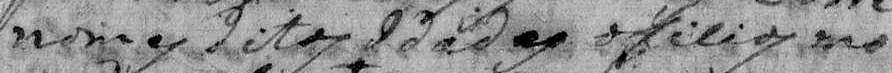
nomes ditos Idades oficios mo
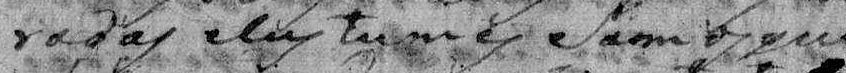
radas e custumes sam os que
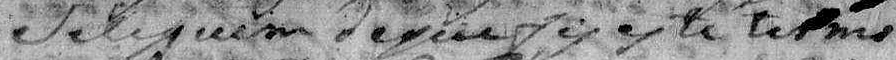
se seguem de que fis este termo
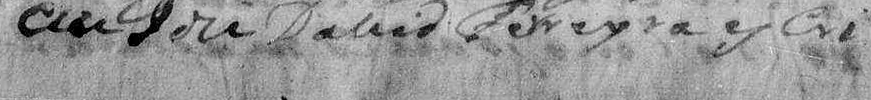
e eu Ioze Dauid Ferreyra escri
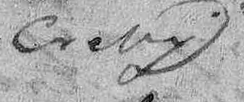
crevy
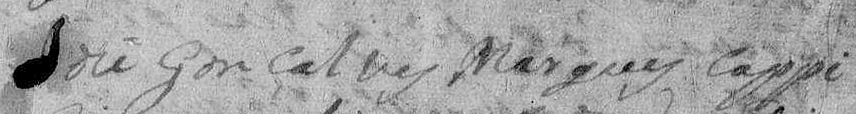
Ioze Gonçalves Marques Cappi
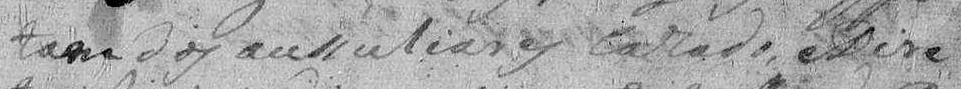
tam dos aussuliares cazado, e Dire
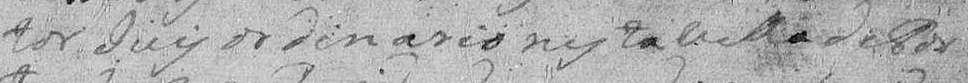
tor Iuis ordinario nesta villa de Por
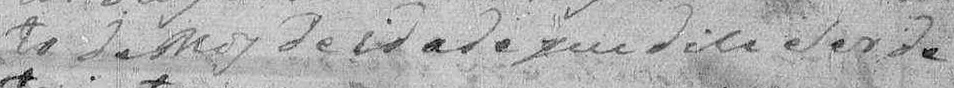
to de mos de idade que dice ser de
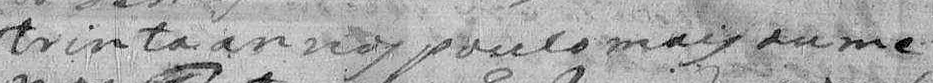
trinta annos pouco mais ou me
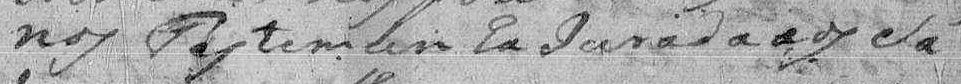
nos Testemunha Iurada aos Sā
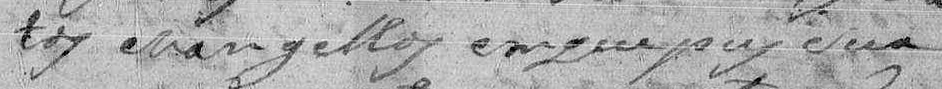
tos evangelhos em que pus sua
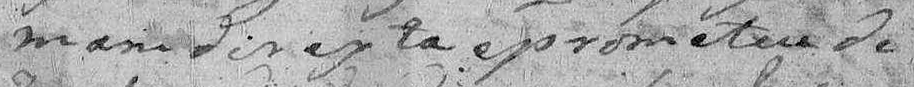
mam direyta e prometeu de
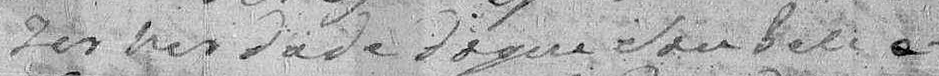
Zer verdade do que soubece e
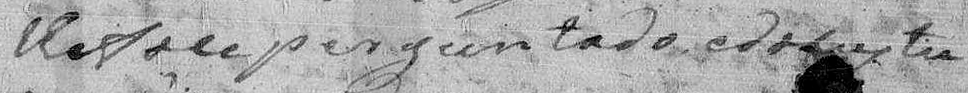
lhe foce perguntado e do custu
